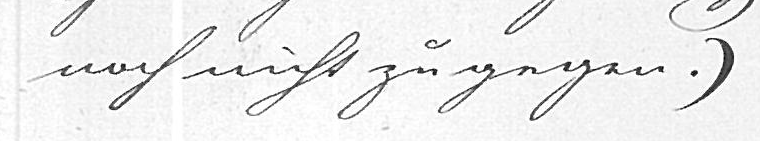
noch nicht zugegen.)
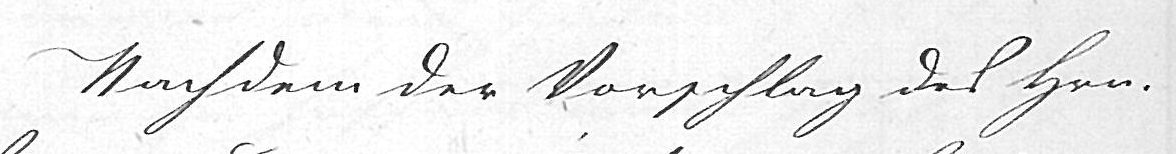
Nachdem der Vorschlag des Hrn.
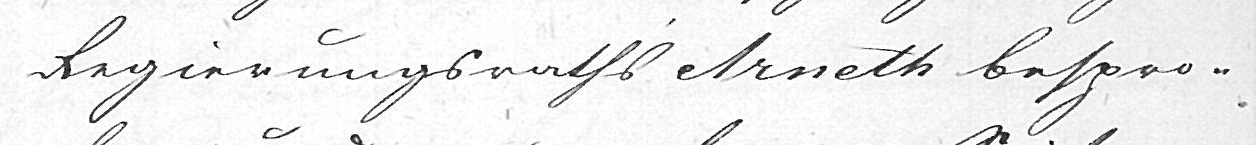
Regierungsraths Arneth bespro-
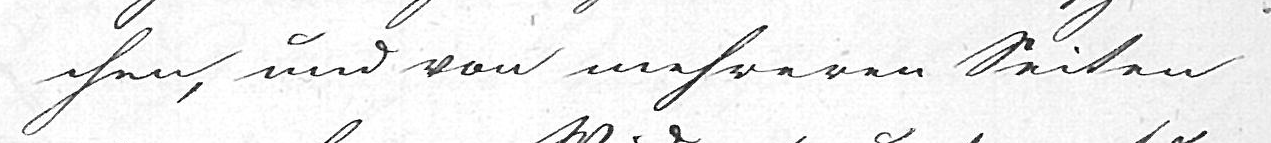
chen und von mehreren Seiten
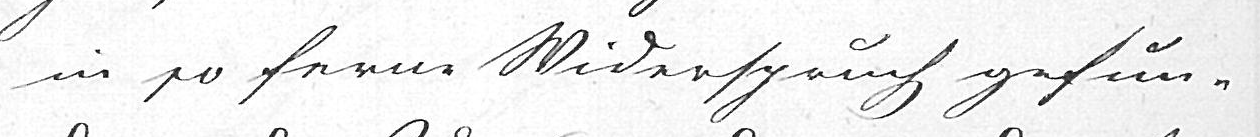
in so ferne Widerspruch gefun-
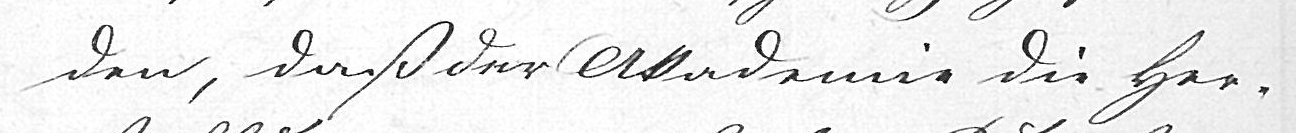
den daß der Akademie die Her-
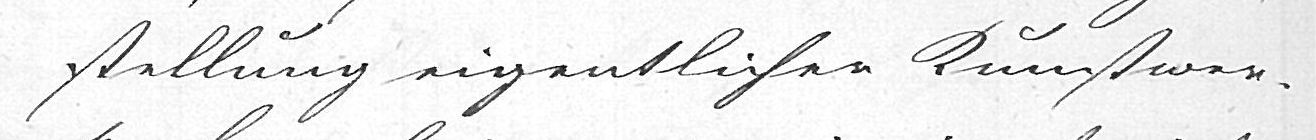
stellung eigentlicher Kunstwer-
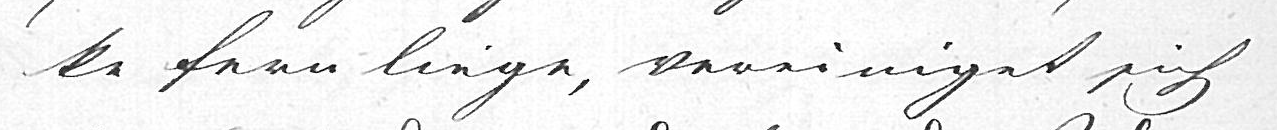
ke fern liege, vereiniget sich
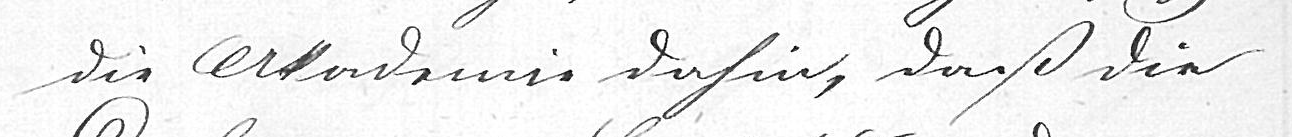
die Akademie dahin, daß die
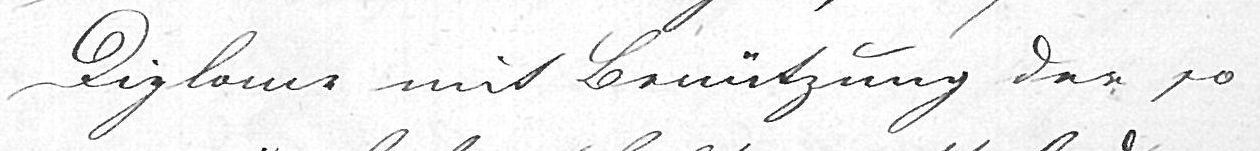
Diplome mit Benützung der so
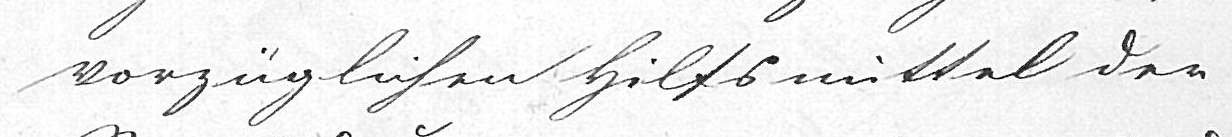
vorzüglichen Hilfsmittel der
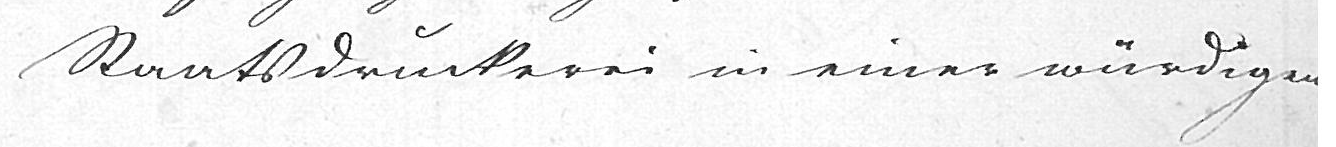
Staatsdruckerei in einer würdigen
